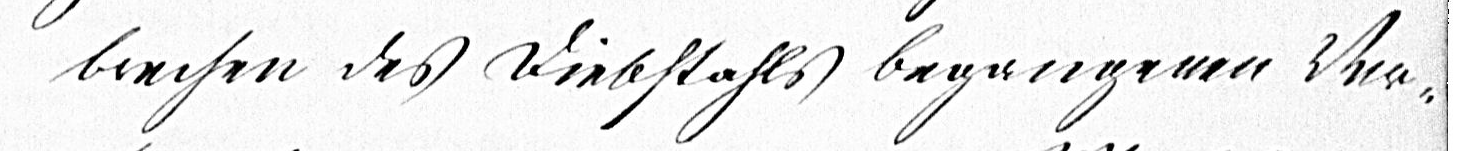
brechen des Diebstahls begangenen Ver¬
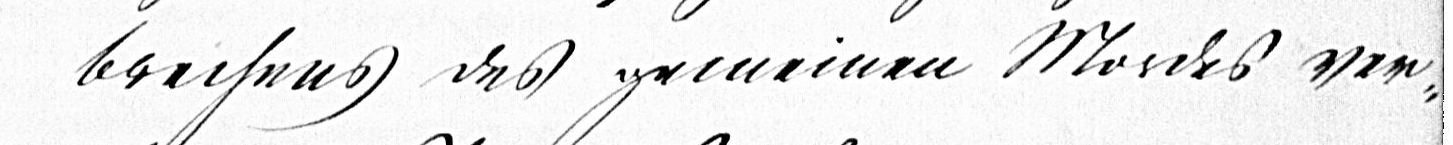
brechens des gemeinen Mordes ver¬
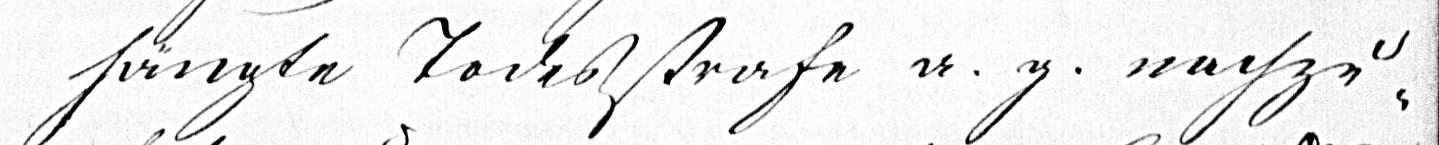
hängte Todesstrafe a. g. nachzu¬
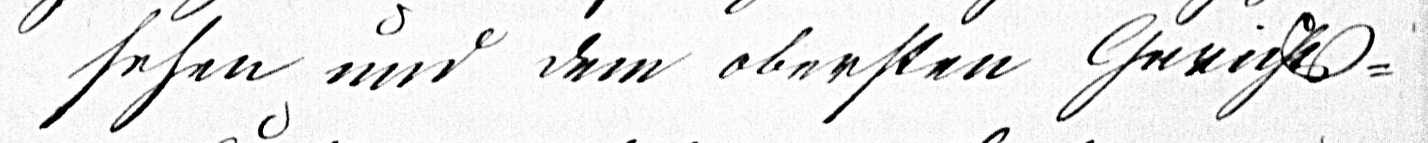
sehen und dem obersten Gerichts¬
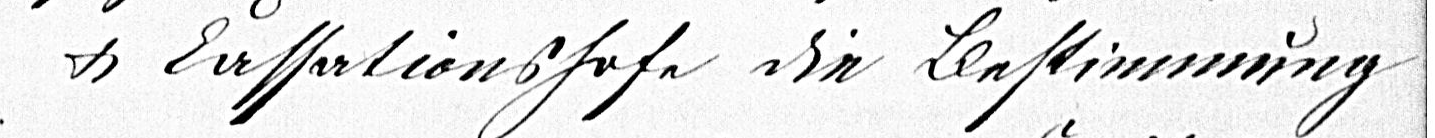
xx Cassatonshofe die Bestimmung
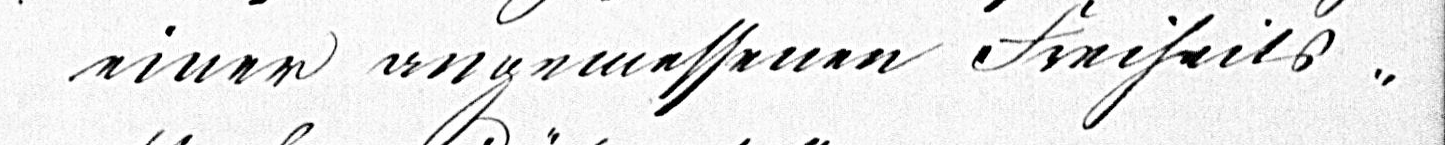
einer angemessenen Freiheits¬
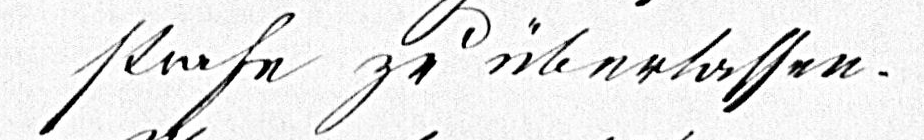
strafe zu überlassen.
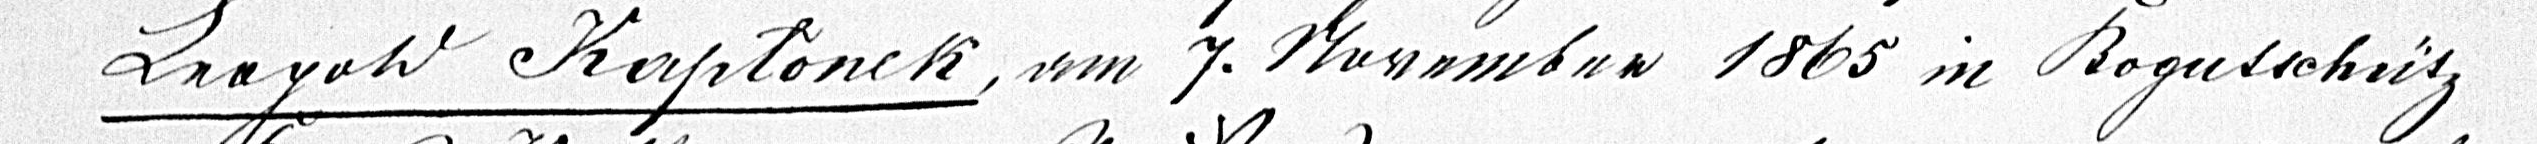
Leopold Kaptonck, am 7. November 1865 in Bogutschütz
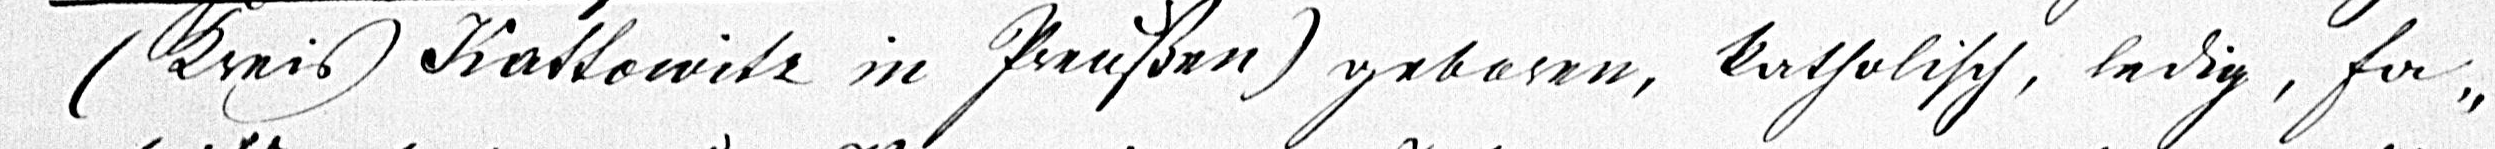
(Kreis Kattowitz in Preußen) geboren, katholisch, ledig, fa¬
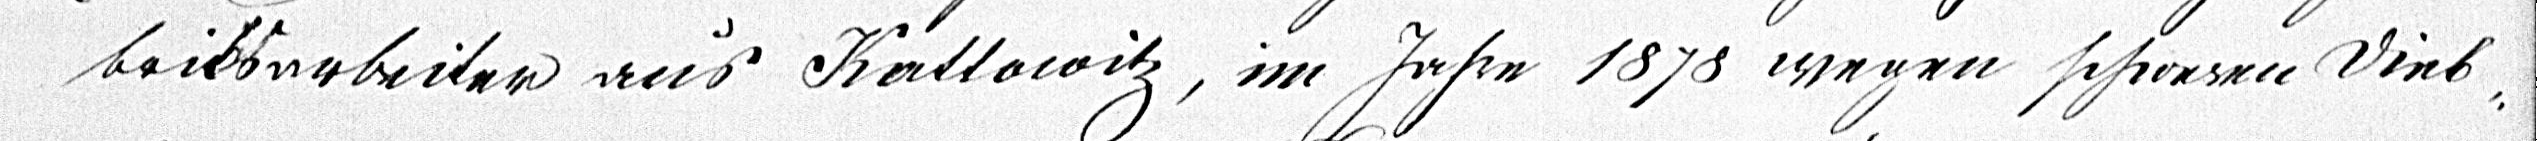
briksarbeiter aus Kattowitz, im Jahre 1878 wegen schweren Viel¬
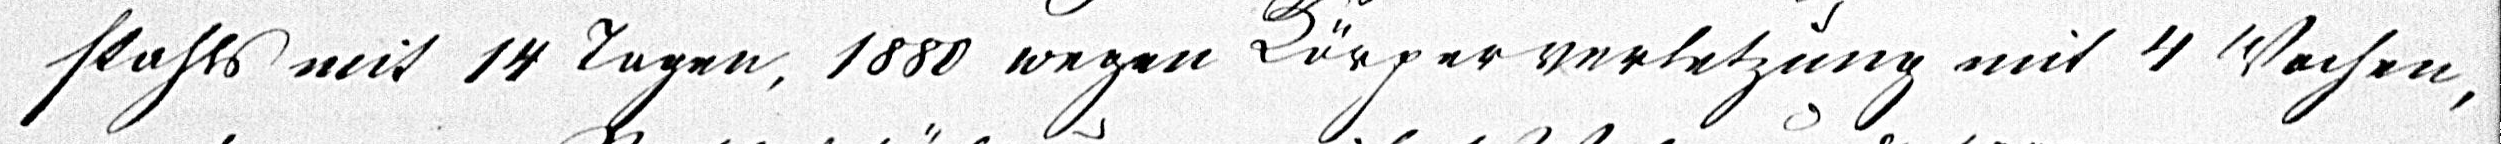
stahls mit 14 Tagen, 1880 wegen Körperverletzung mit 4 Wochen,
